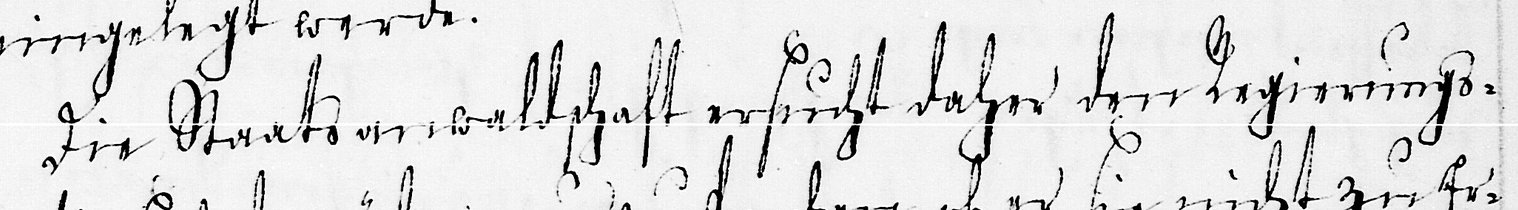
Die Staatsanwaldschaft ersucht daher den Regierungs¬
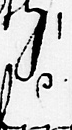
d.
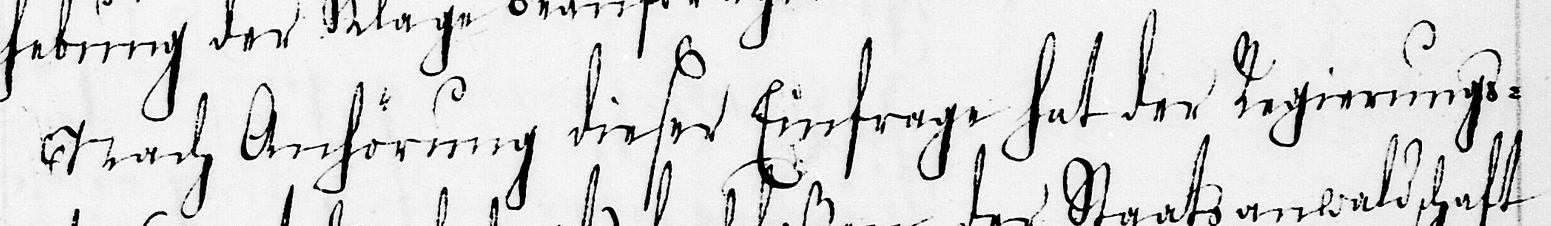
Nach Anhörung dieser Einfrage hat der Regierungs¬
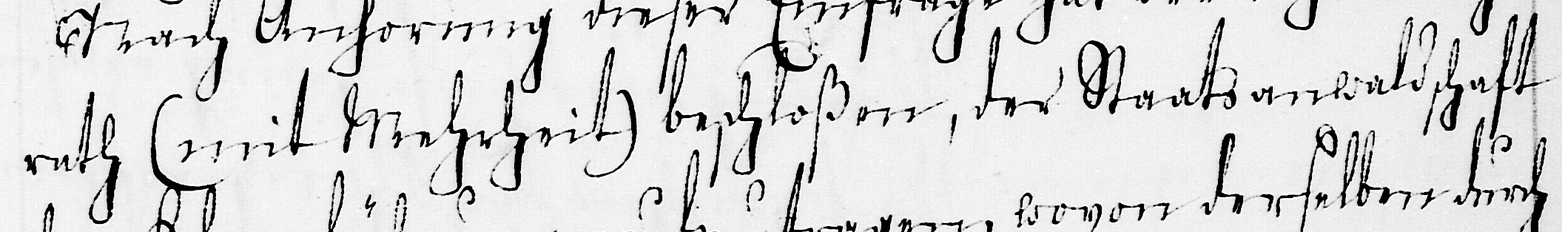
rath (mit Mehrheit) beschloßen, der Staatsanwaldschaft
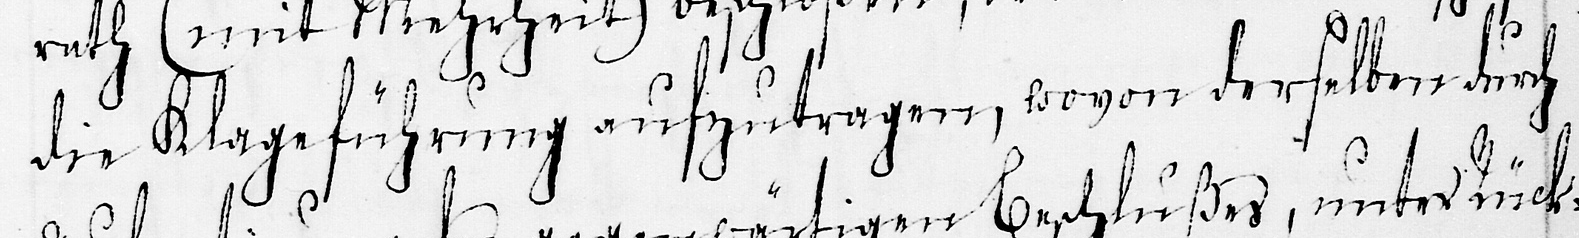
die Klageführung aufzutragen, wovon derselben durch
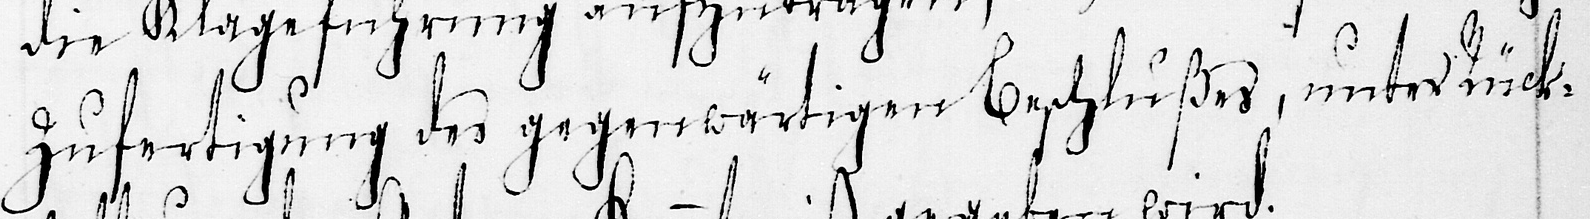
Zufertigung des gegenwärtigen Beschlußes, unter Rück¬
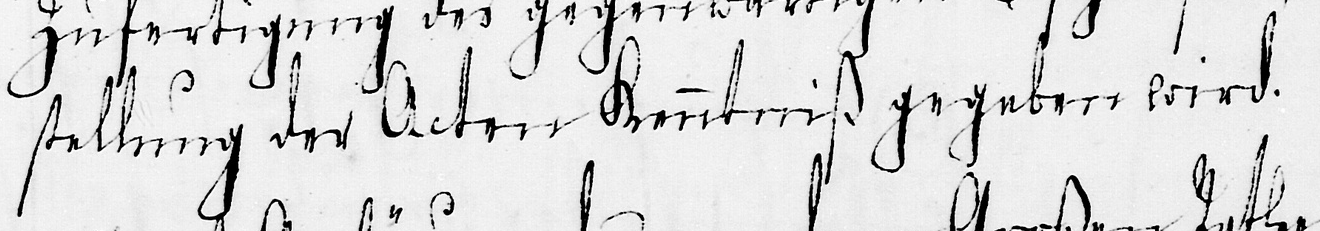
stellung der Acten Kenntniß gegeben wird.
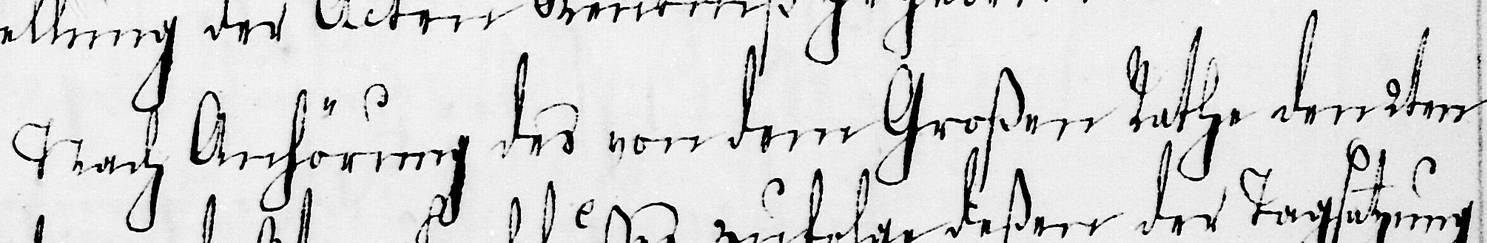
Nach Anhörung des von dem Großen Rathe den 2ten
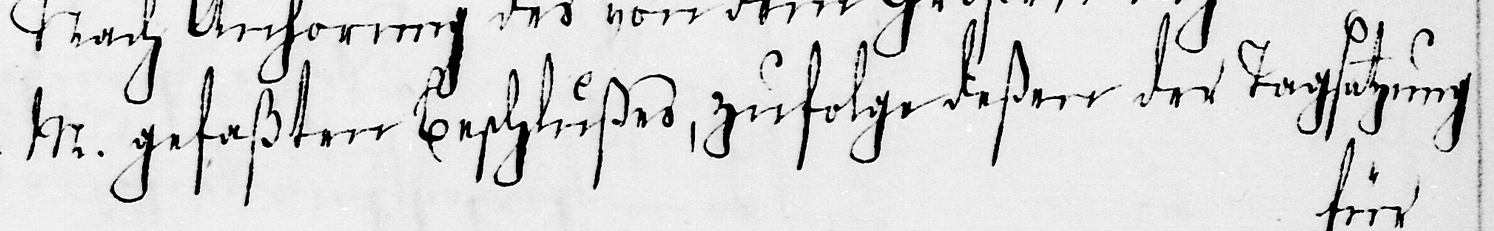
M. gefaßten Beschlußes, zufolge deßen der Tagsatzung
